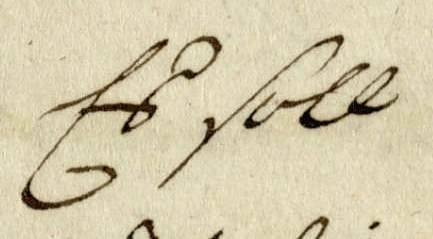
Es soll
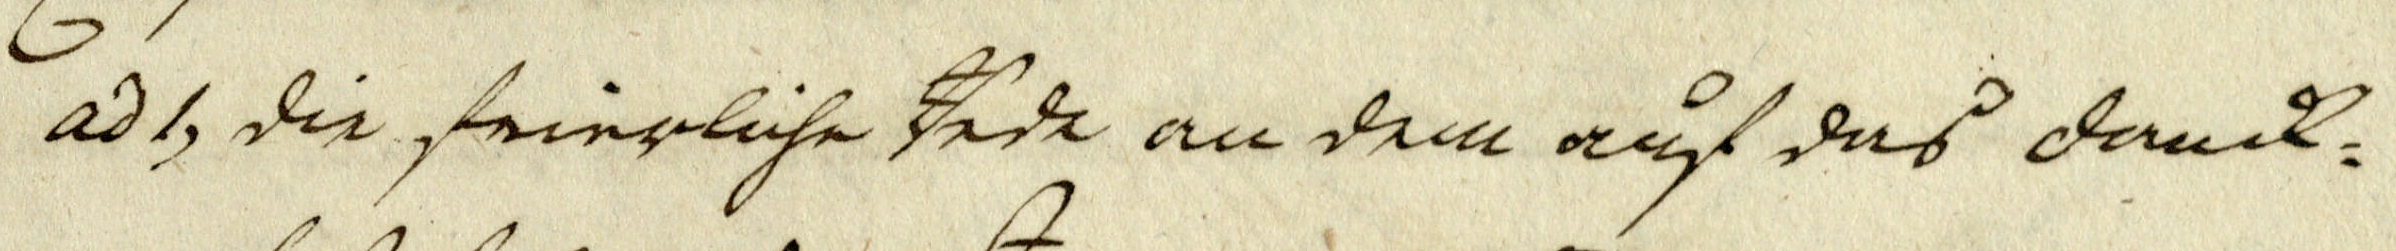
ad 1, die feierliche Rede an dem auf das Danck¬
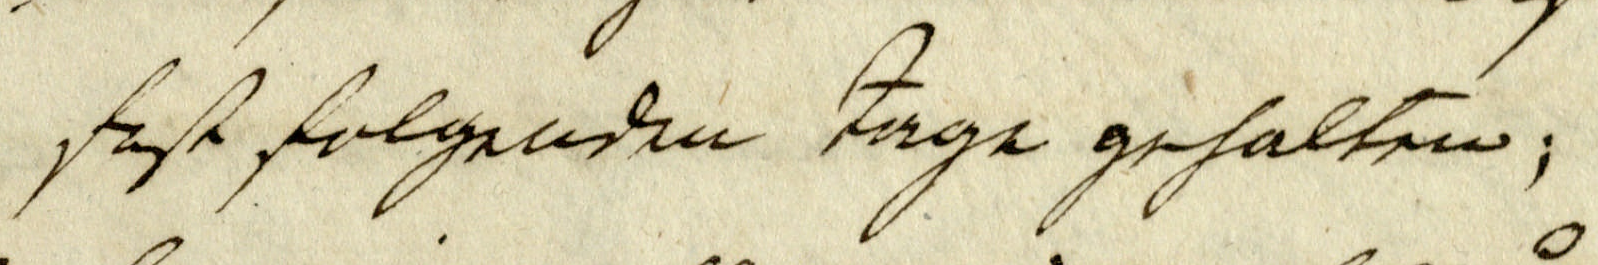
fest folgenden Tage gehalten;
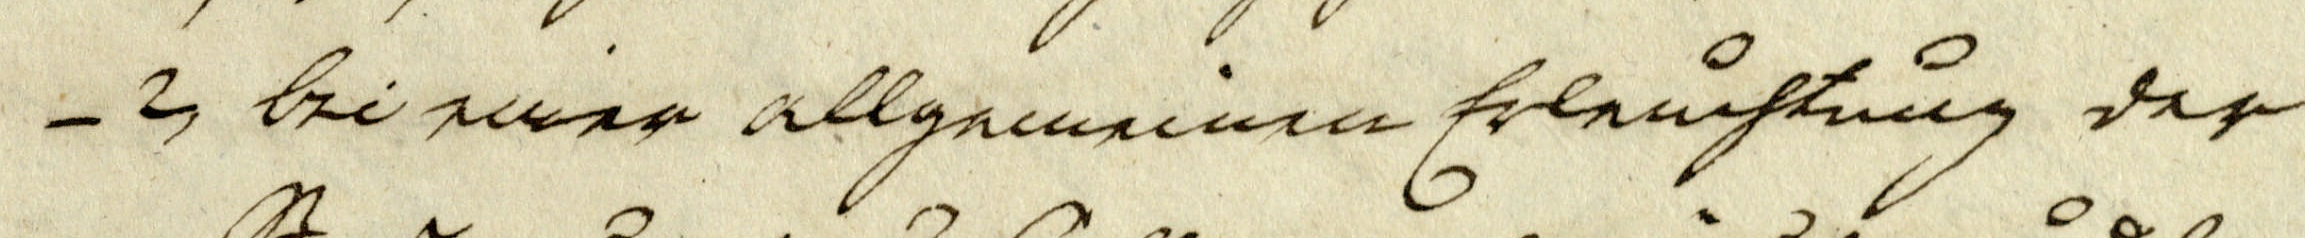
2, bei einer allgemeinen Erleuchtung der
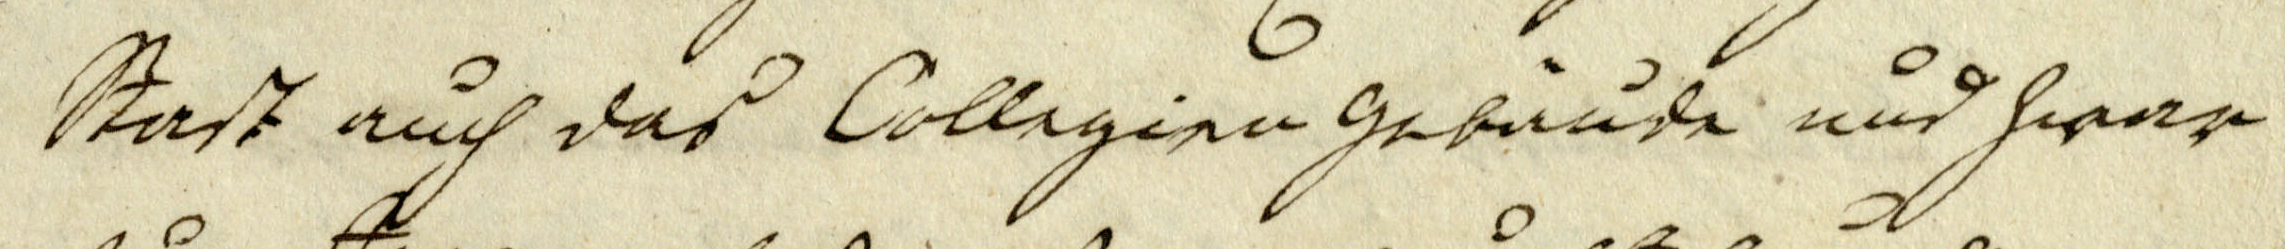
Stadt auch das Collegien Gebäude und zwar
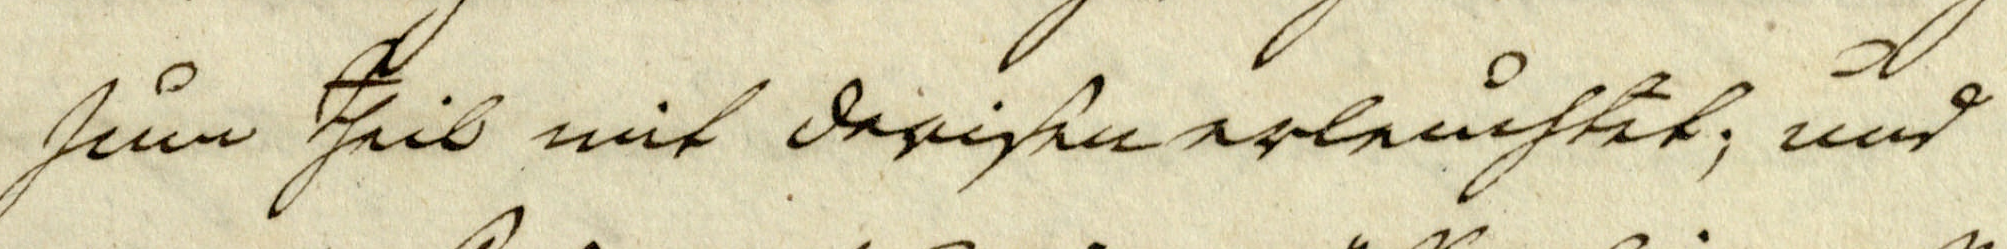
zum Theil mit Devisen erleuchtet; und
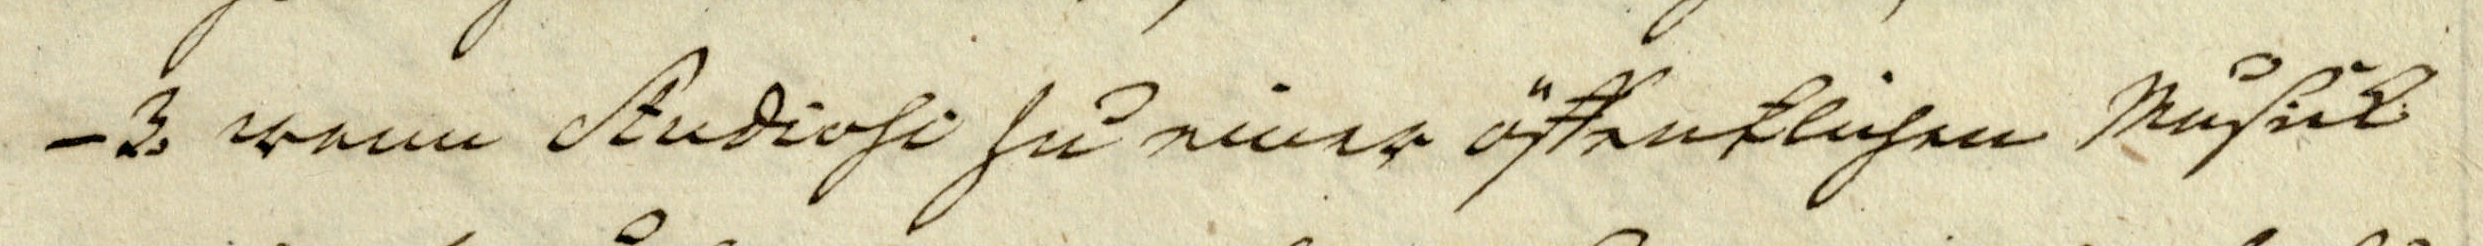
3. wenn Studiosi zu einer öffentlichen Musick
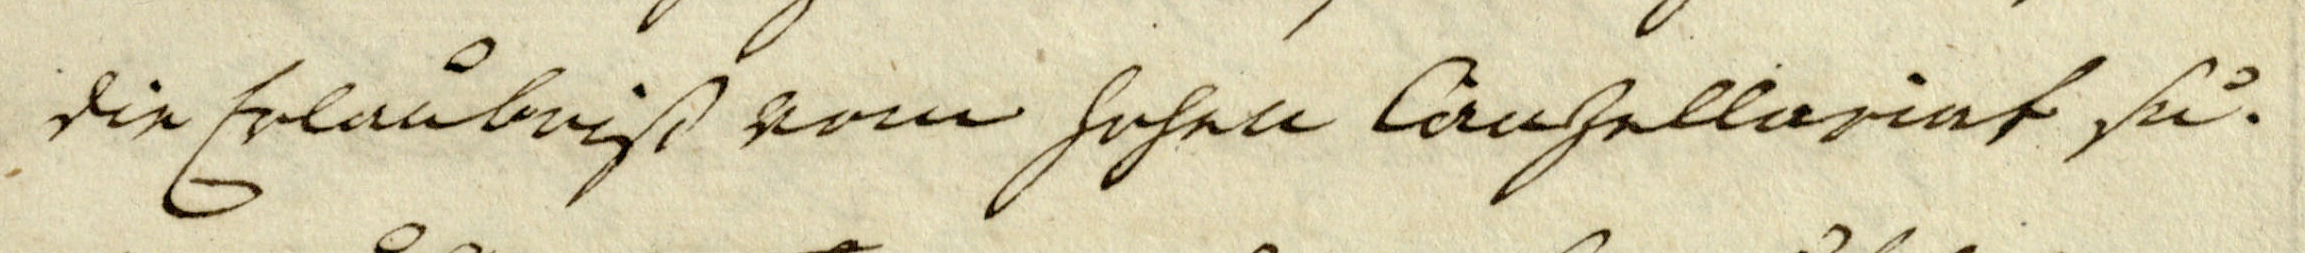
die Erlaubniß vom hohen Canzellariat su¬
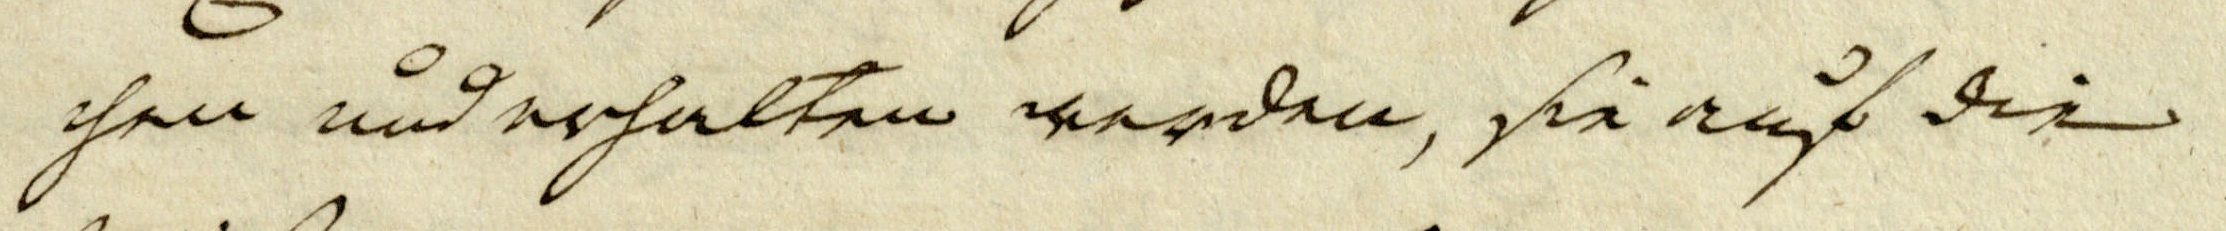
chen und erhalten werden, sie auf die
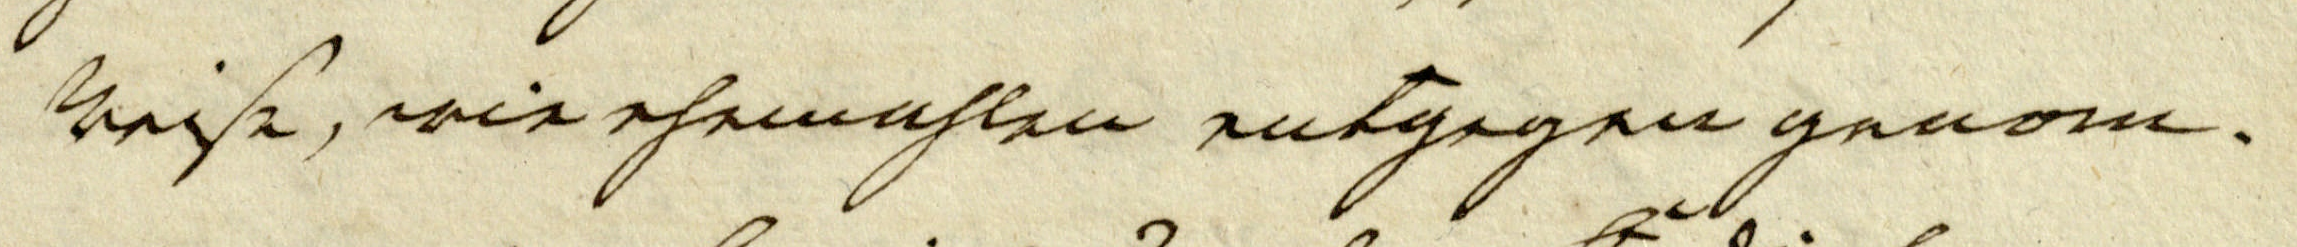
Weise, wie ehemahlen entgegen genom¬
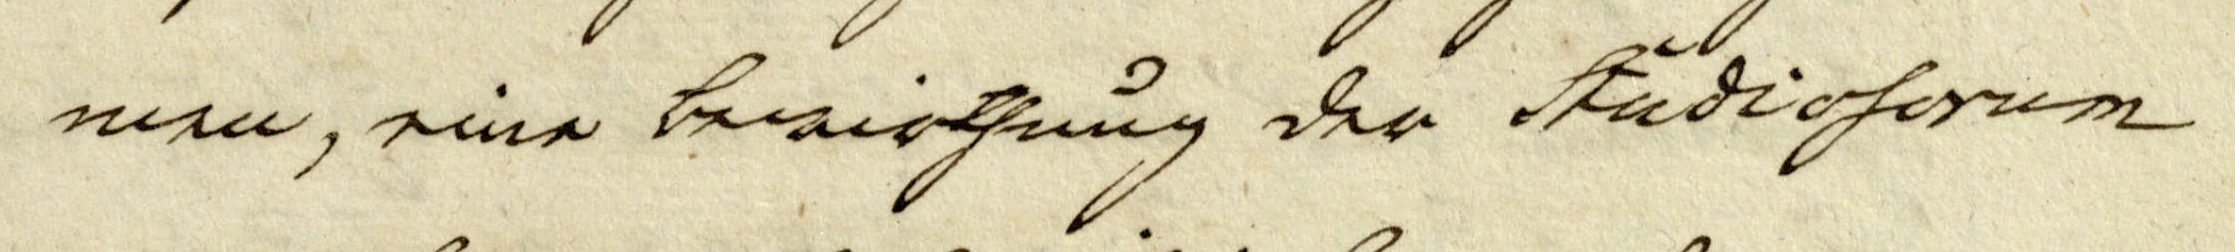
men, eine Bewirthung der Studiosorum
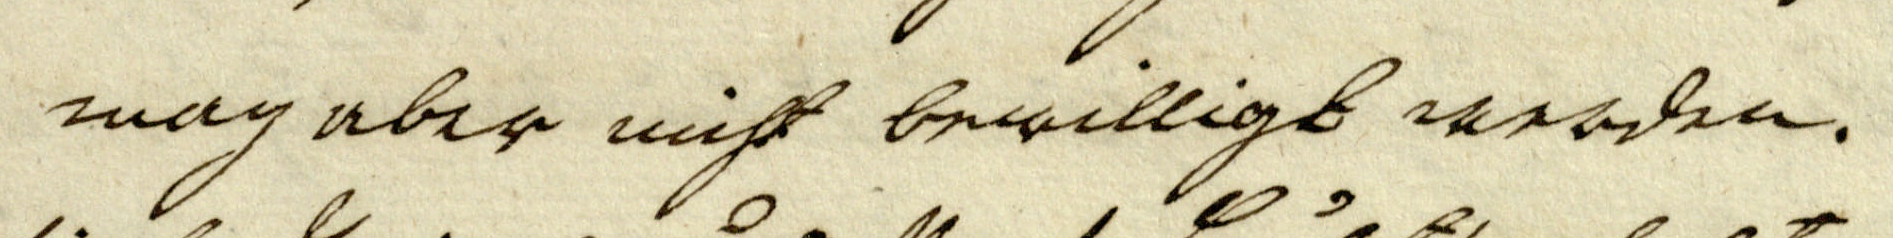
mag aber nicht bewilligt werden.
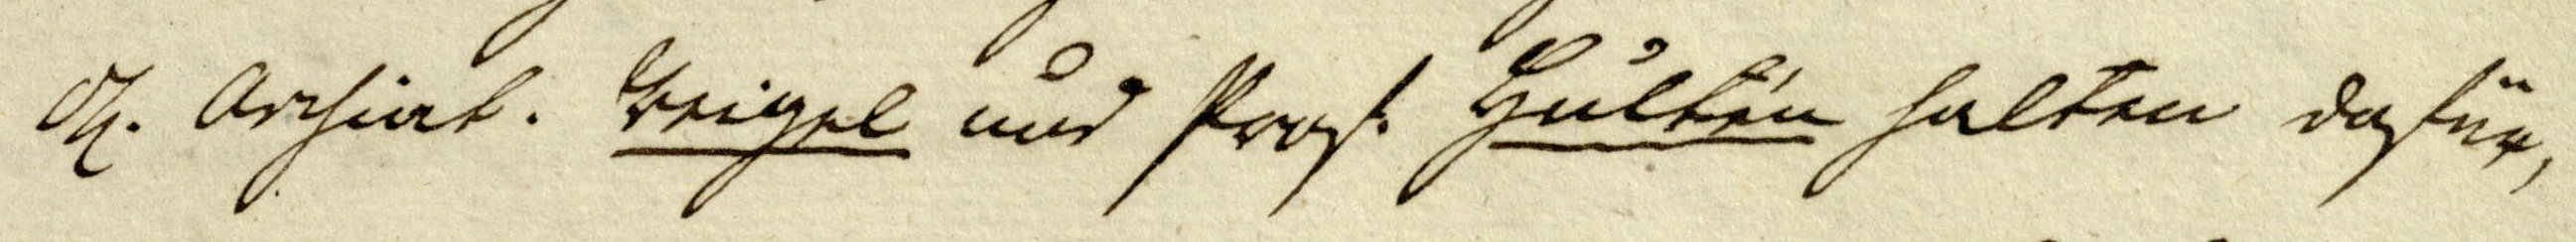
dh. Archiat. Weigel, und Prof. Hultén halten dafür,
